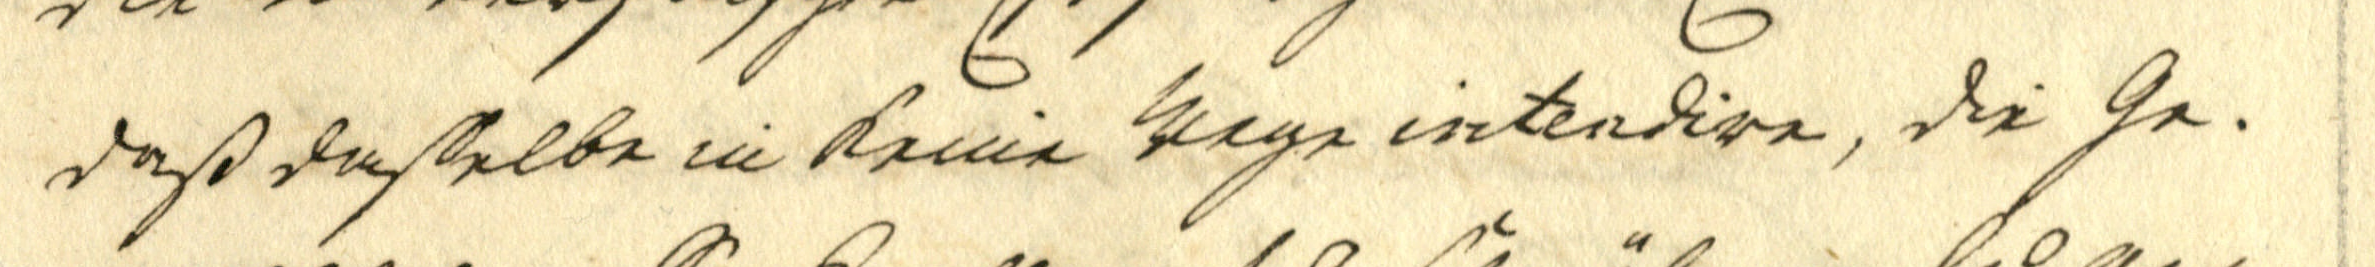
daß dasselbe in keine Wege intendire, die Ge¬
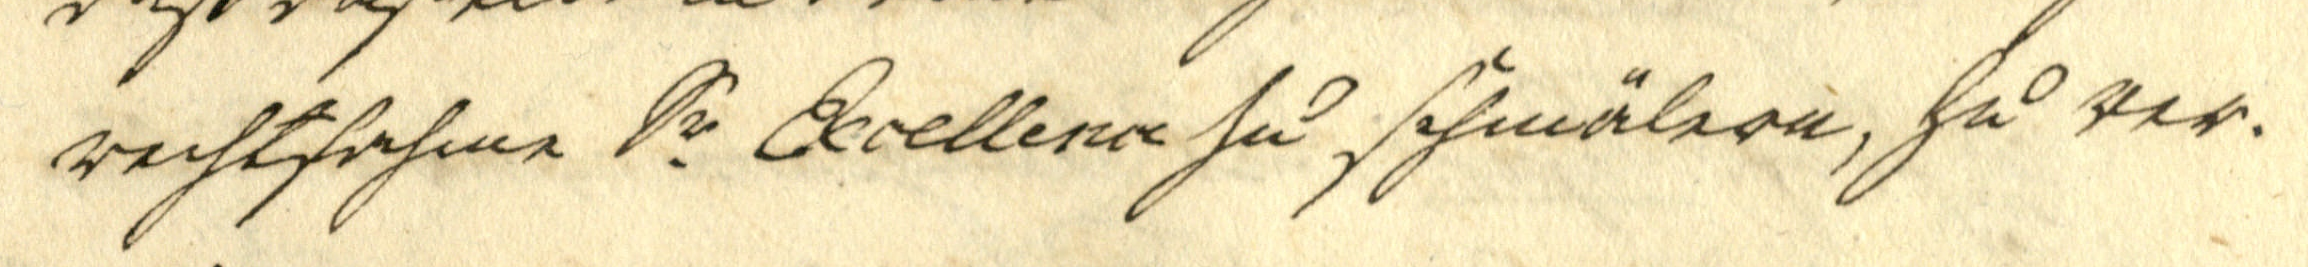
rechtsahme Sr Excellence zu schmälern, zu ver¬
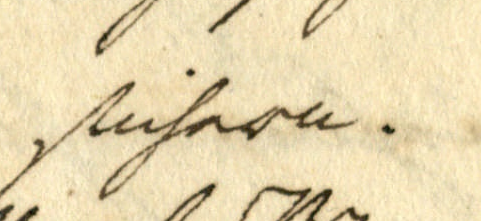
sichern.
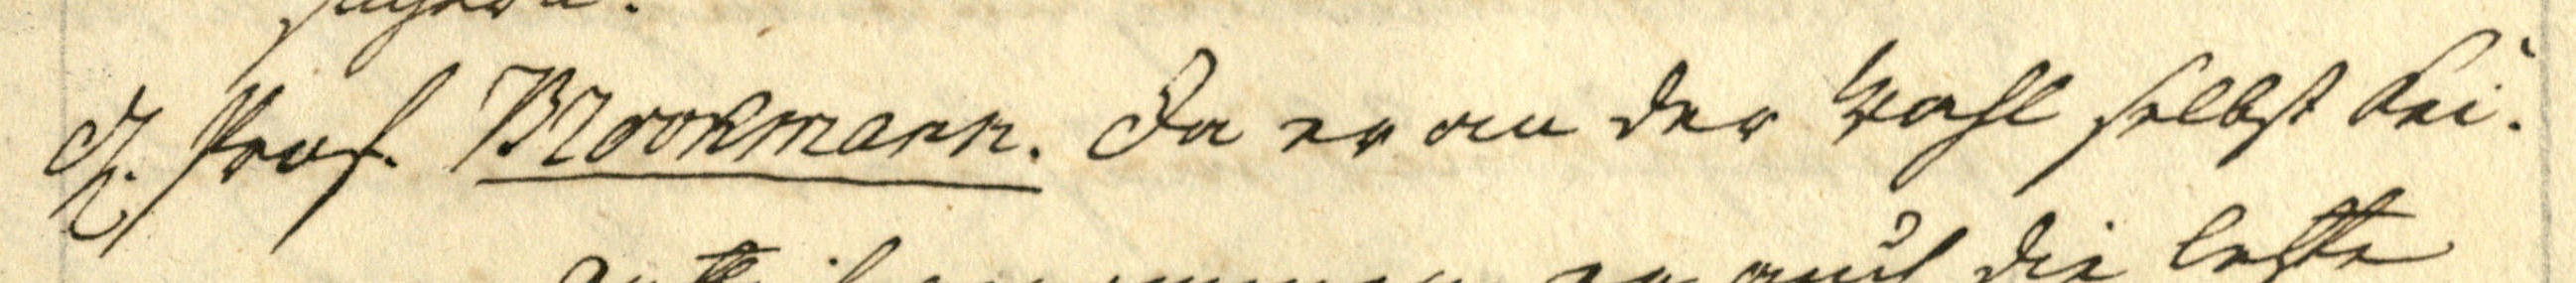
dh. Prof. Brockmann. Da er an der Wahl selbst kei¬
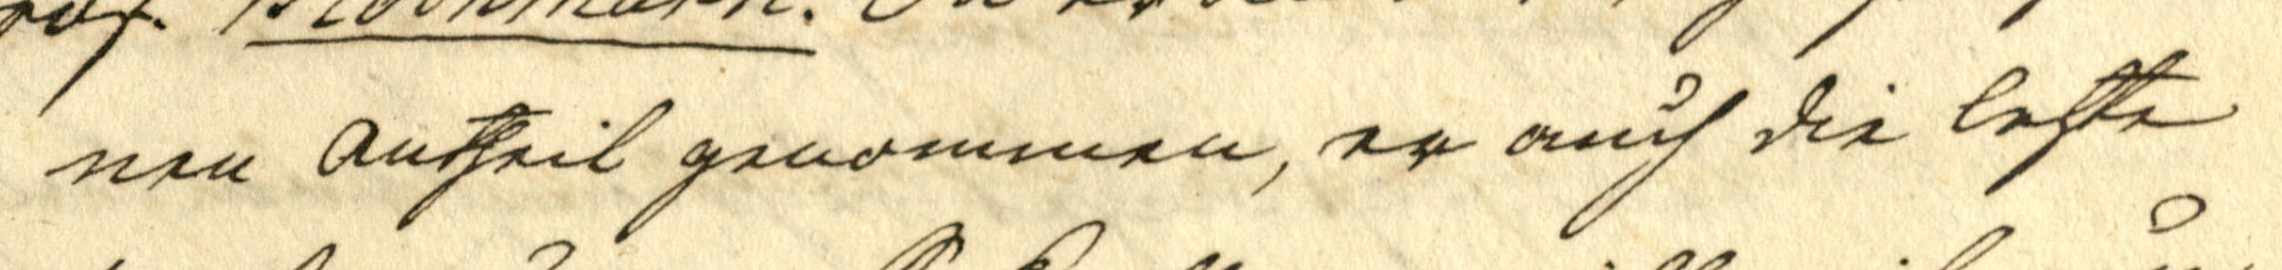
nen Antheil genommen, er auch die letzte
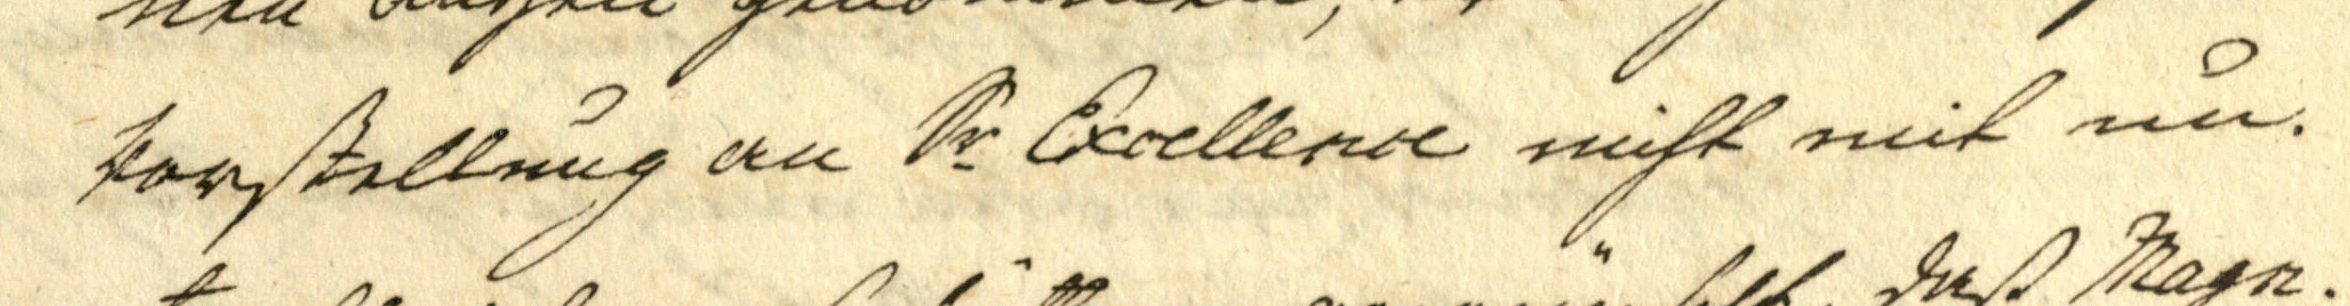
Vorstellung an Sr Excellence nicht mit un¬
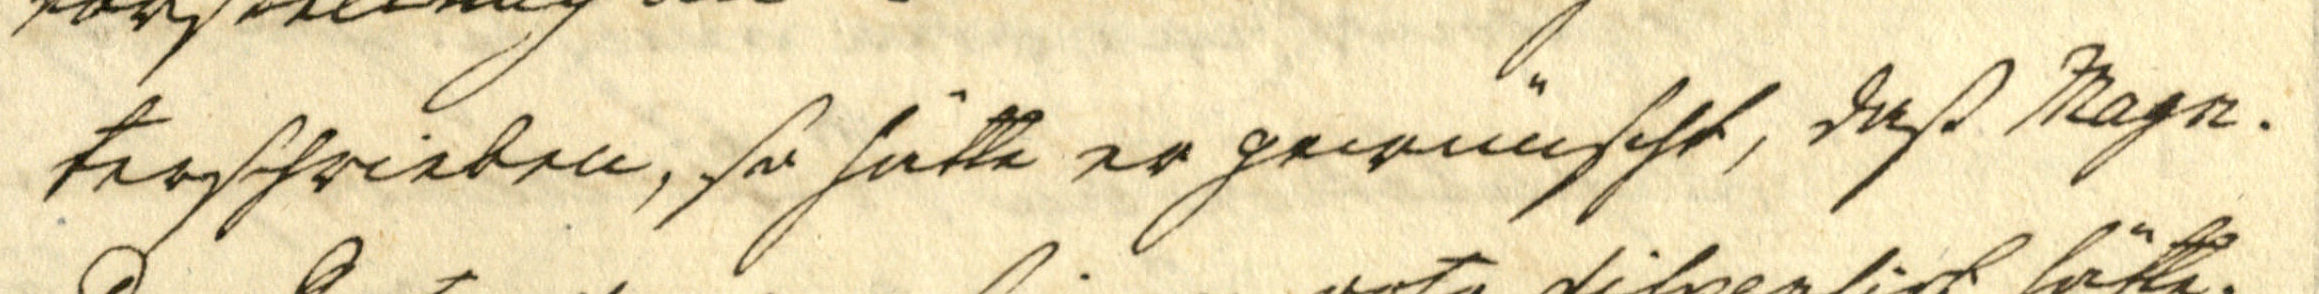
terschrieben, so hätte er gewünscht, daß Magn.
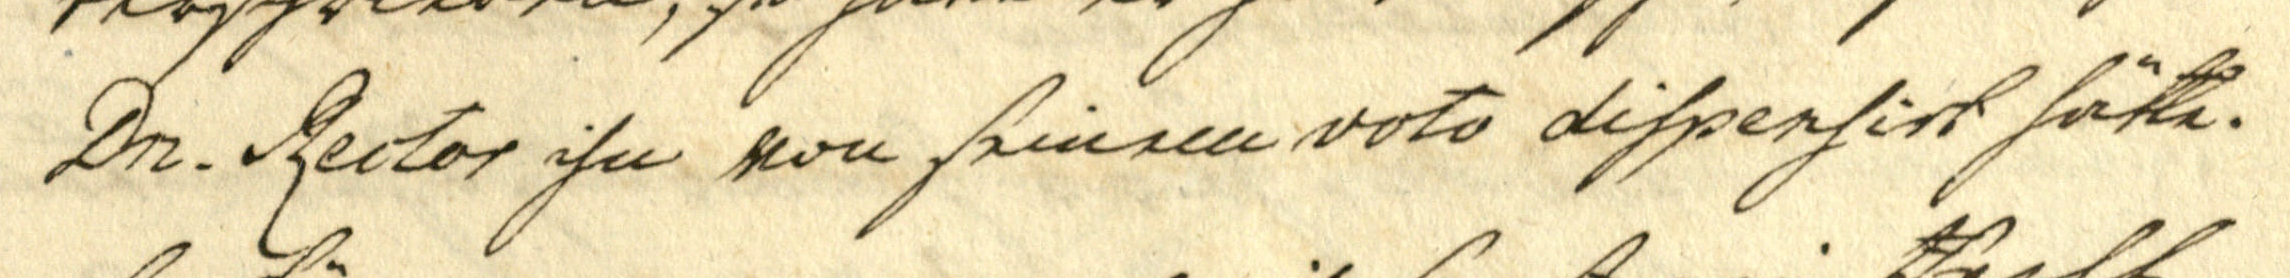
Dn. Rector ihn von seinem voto dispensirt hätte.
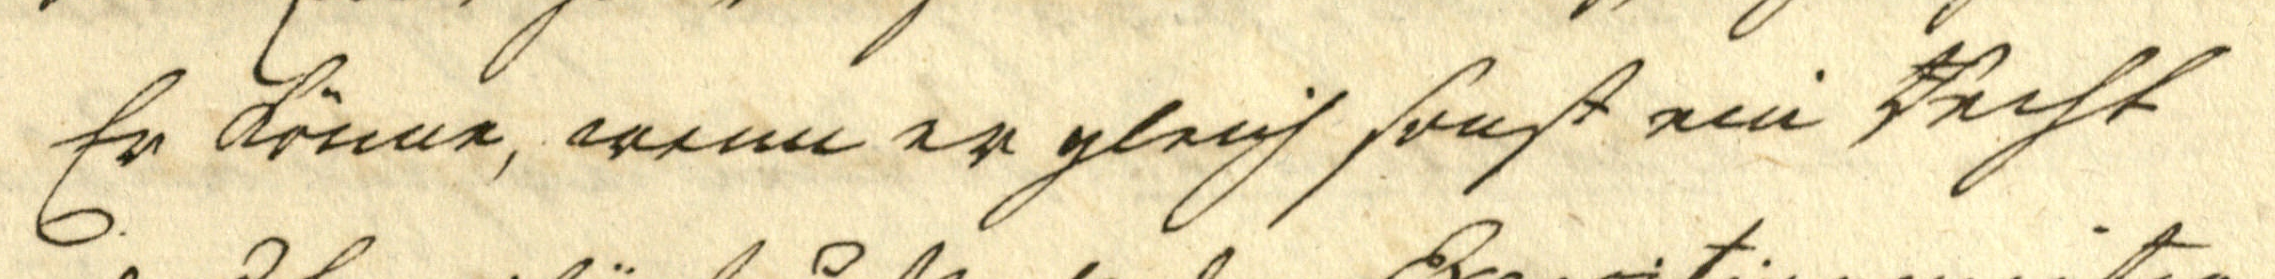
Er könne, wenn er gleich sonst ein Recht
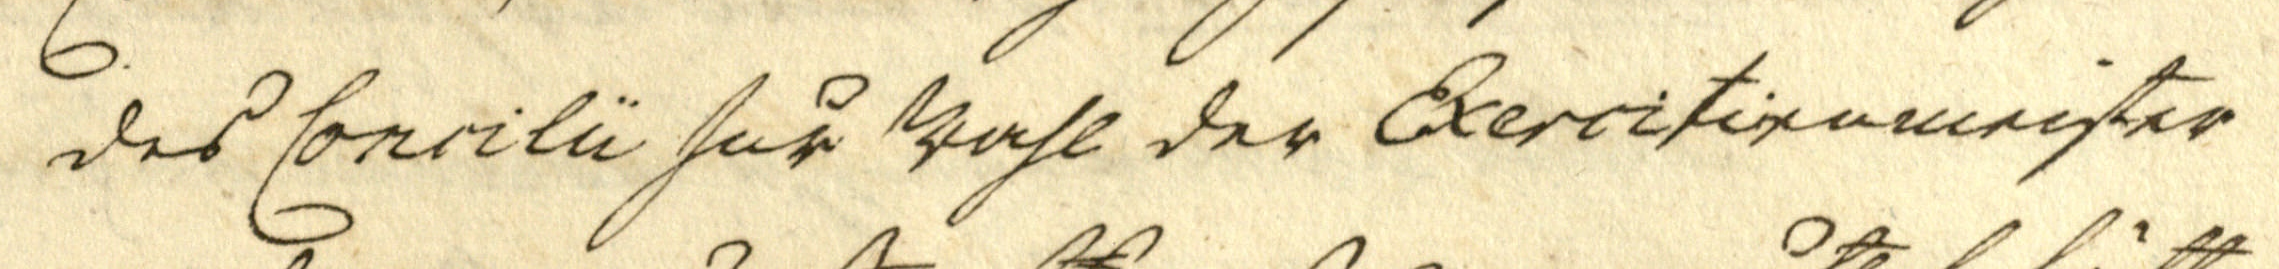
des Concilii zur Wahl der Exercitienmeister
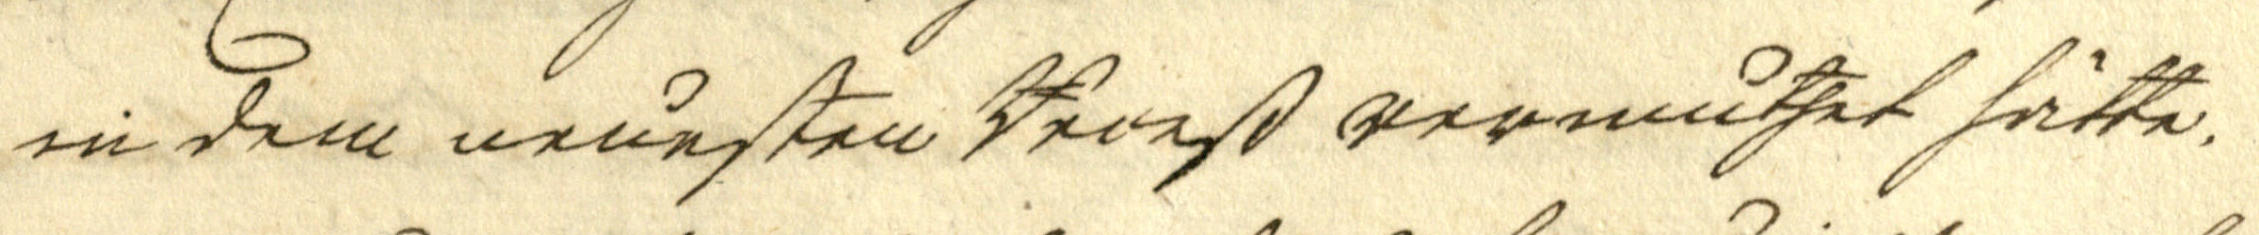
in dem neuesten Receß vermuthet hätte,
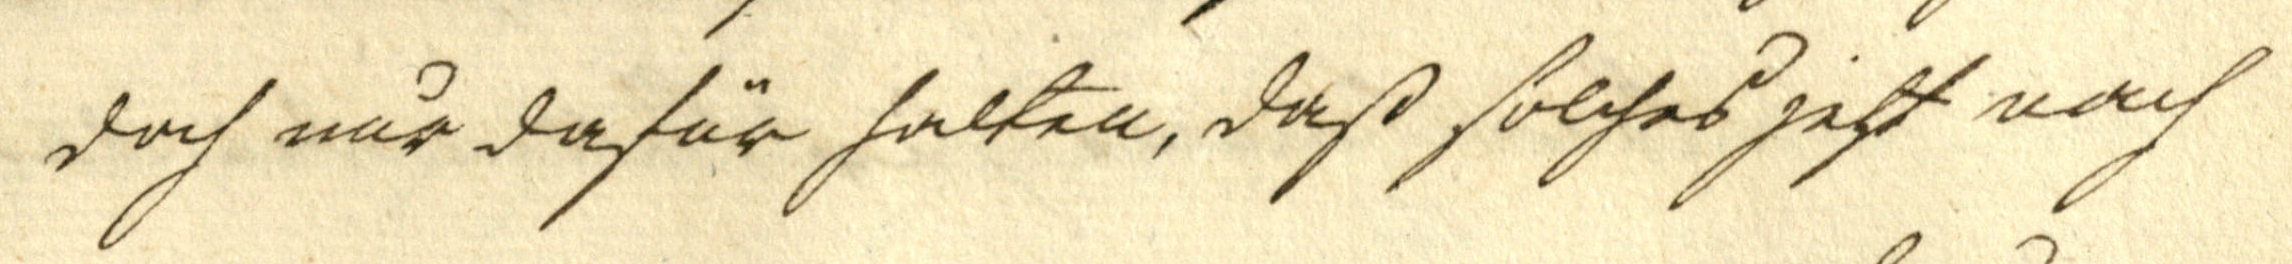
doch nur dafür halten, daß solches jetzt nach
